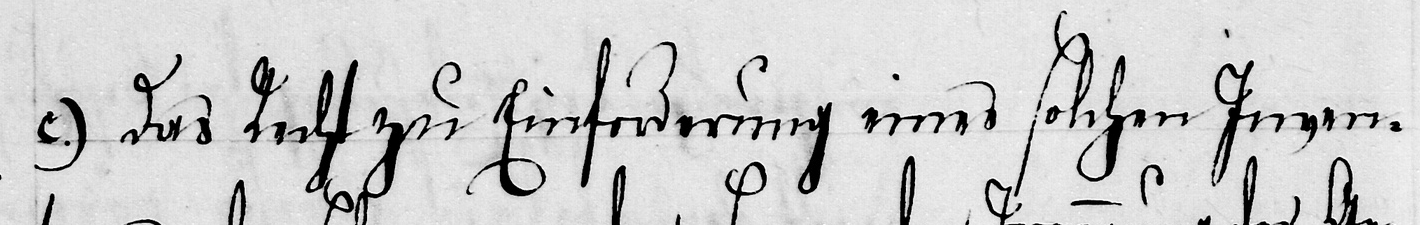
c.) Das Recht zu Einforderung eines solchen Inven¬
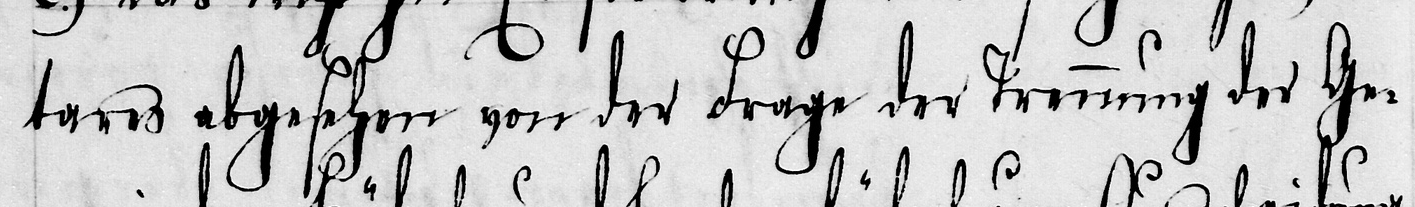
tares abgesehen von der Frage der Trennung der Ge¬
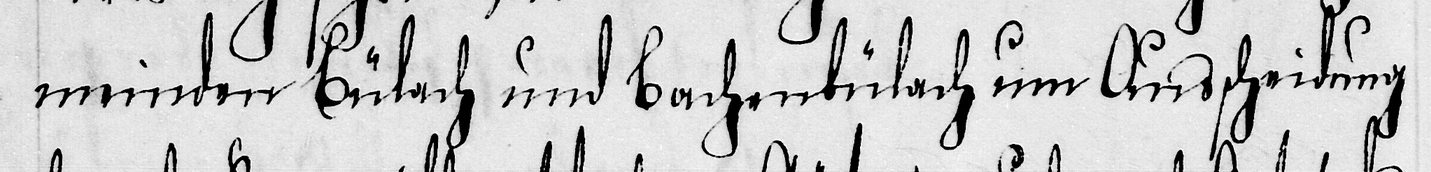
meinden Bülach und Bachenbülach um Ausscheidung
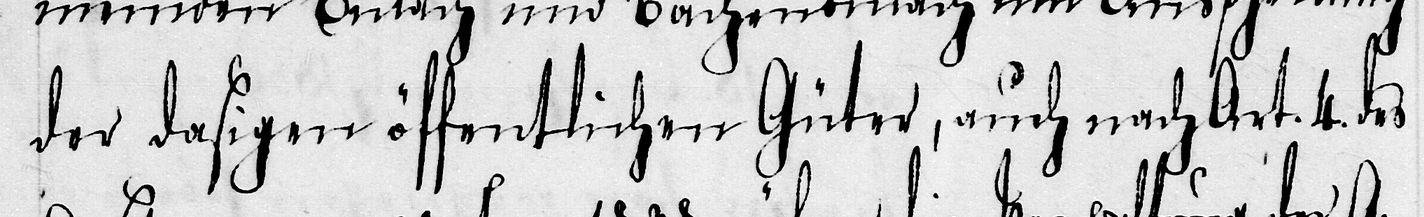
der dasigen öffentlichen Güter, auch nach Art: 4 des
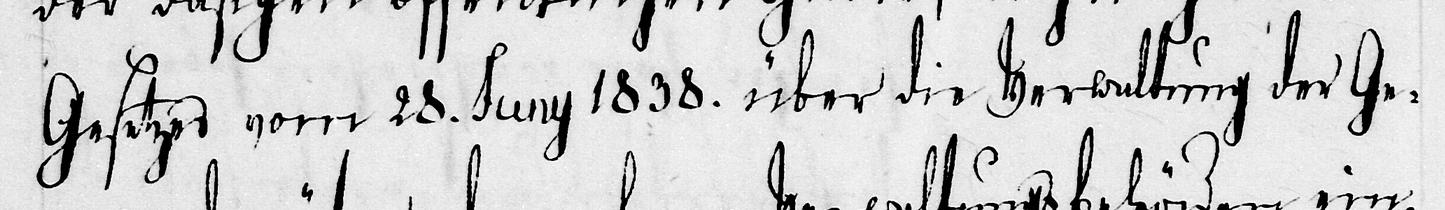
Gesetzes vom 28. Juny 1838. über die Verwaltung der Ge¬
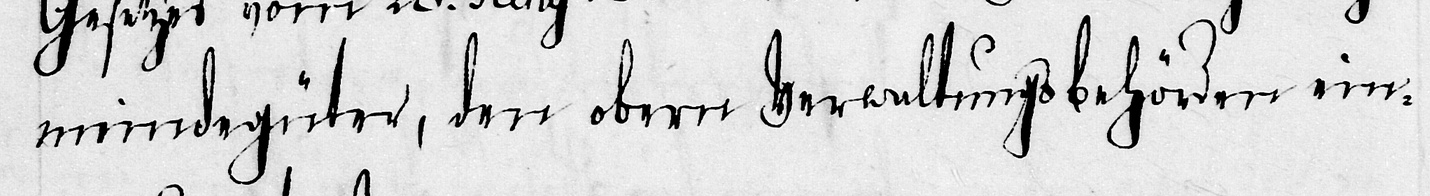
meindegüter, den obern Verwaltungsbehörden ein¬
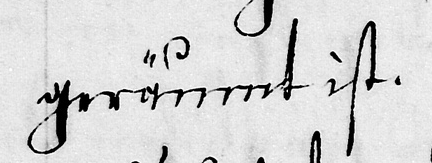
geräumt ist.
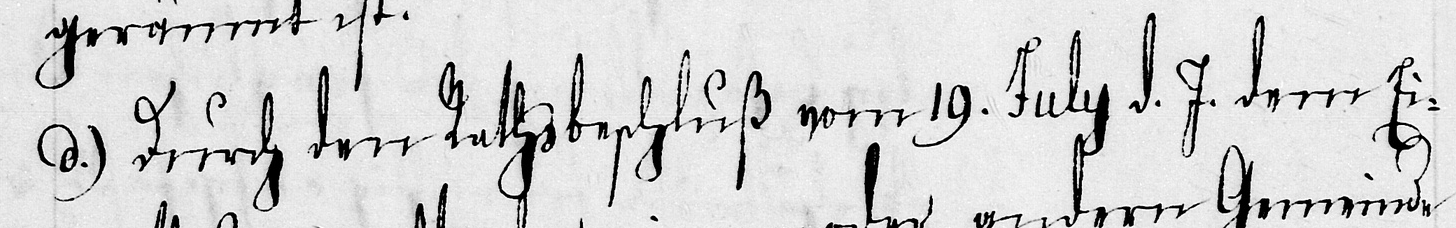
d.) Durch den Rathsbeschluß vom 19. July d. J. dem Ei¬
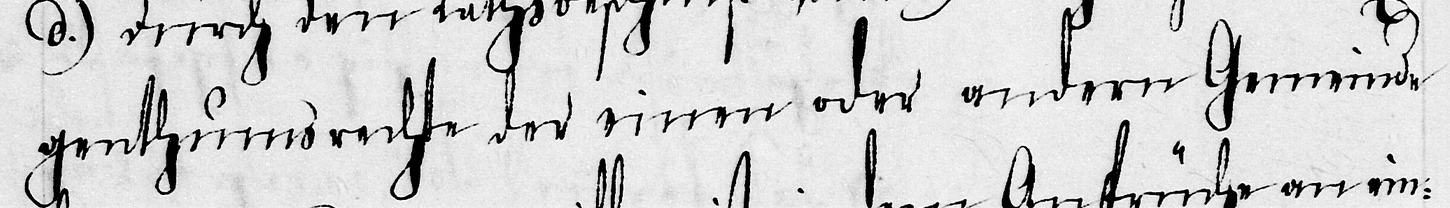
genthumsrechte der einen oder andern Gemeinde
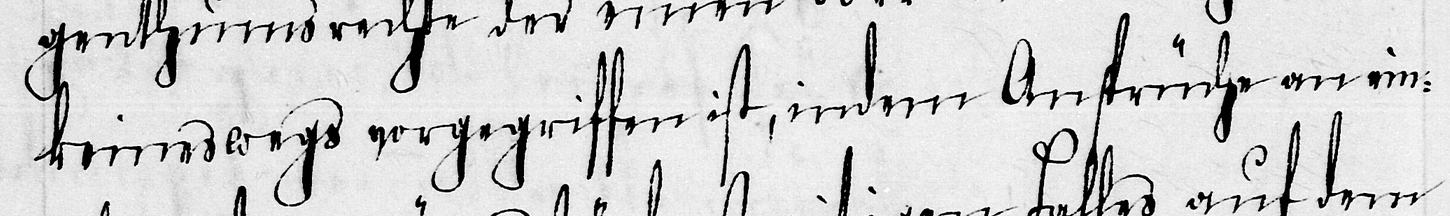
keineswegs vorgegriffen ist, indem Ansprüche an ein¬
